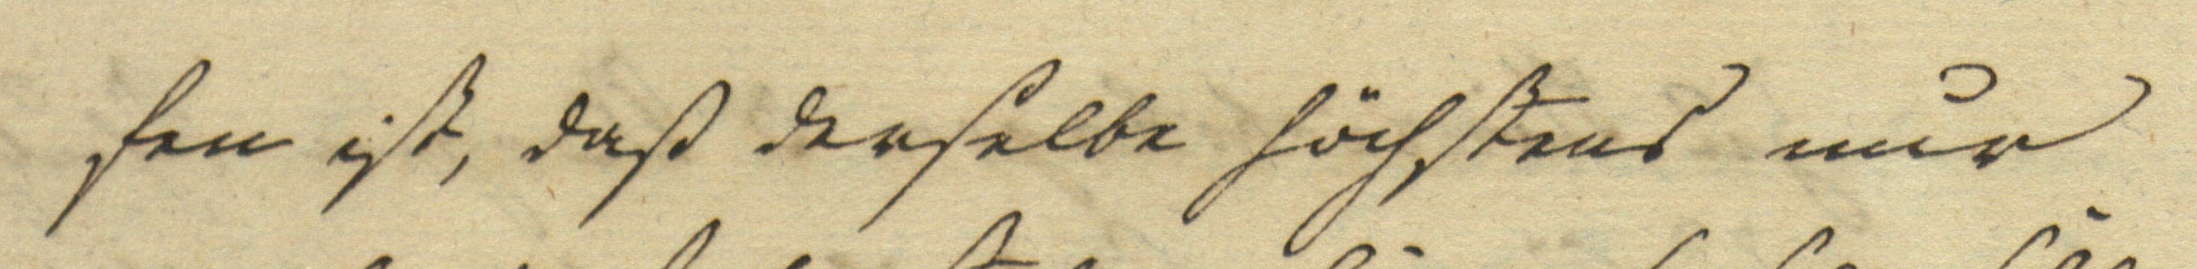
fen ist, daß derselbe höchstens nur
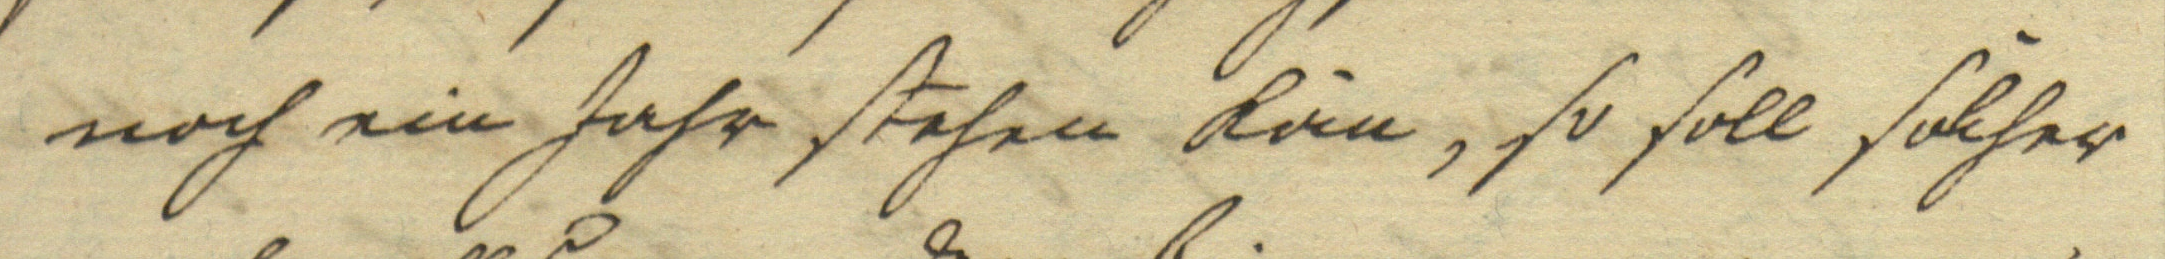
noch ein Jahr stehen kan, so soll solcher
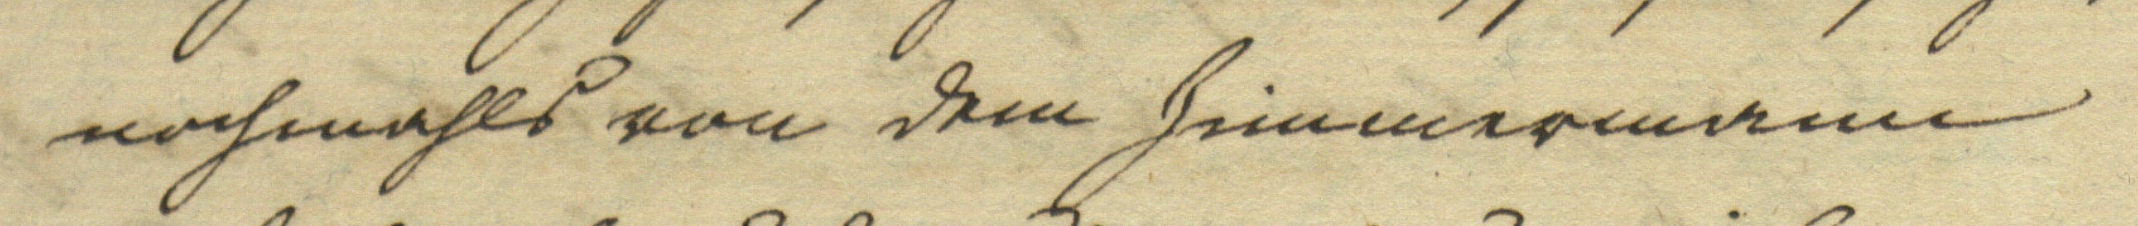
nochmahls von dem Zimmermann
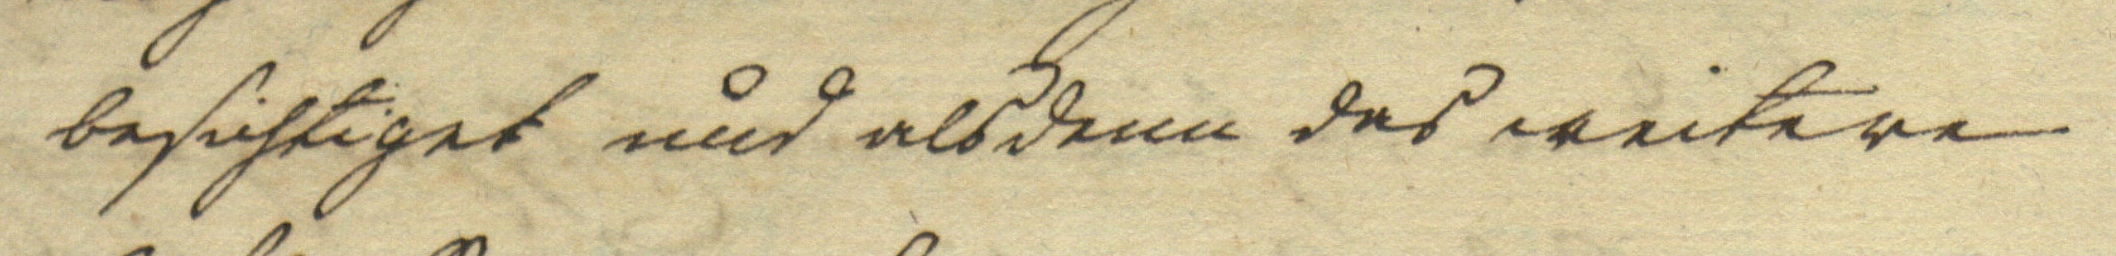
besichtiget und alsdenn das weitere
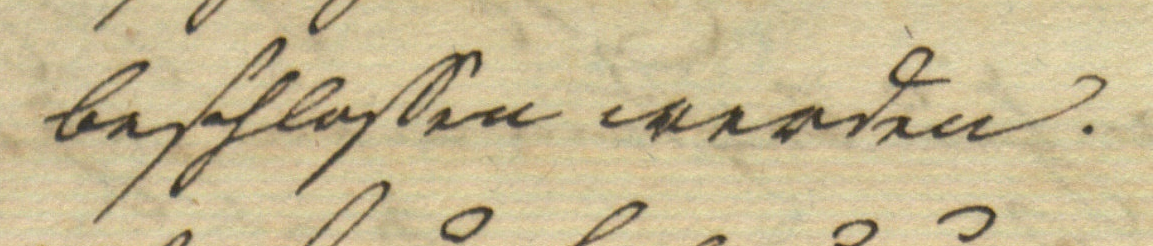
beschlossen werden.
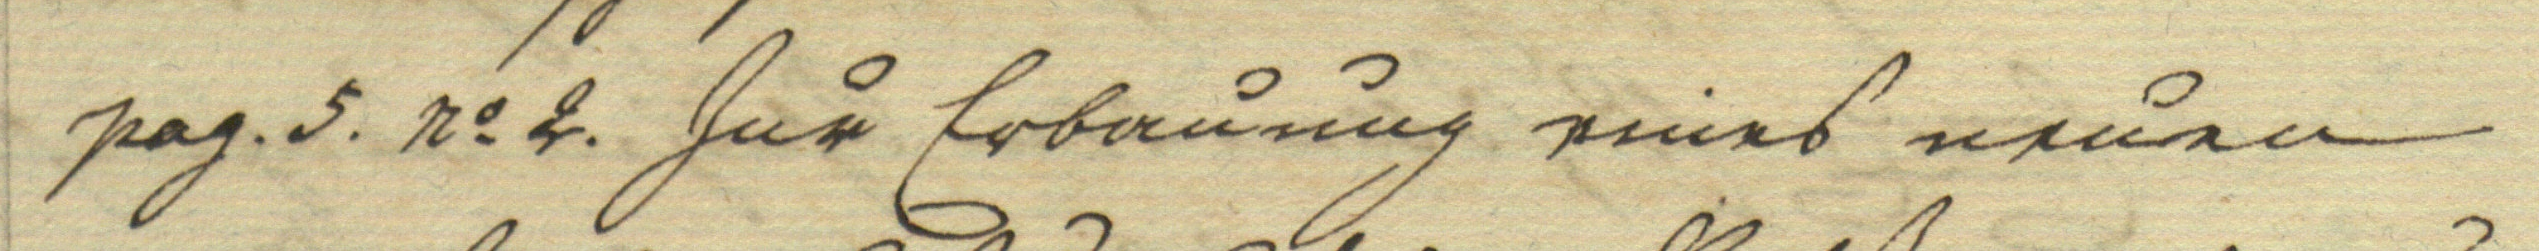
pag. 5. No 2. Zur Erbauung eines neuen
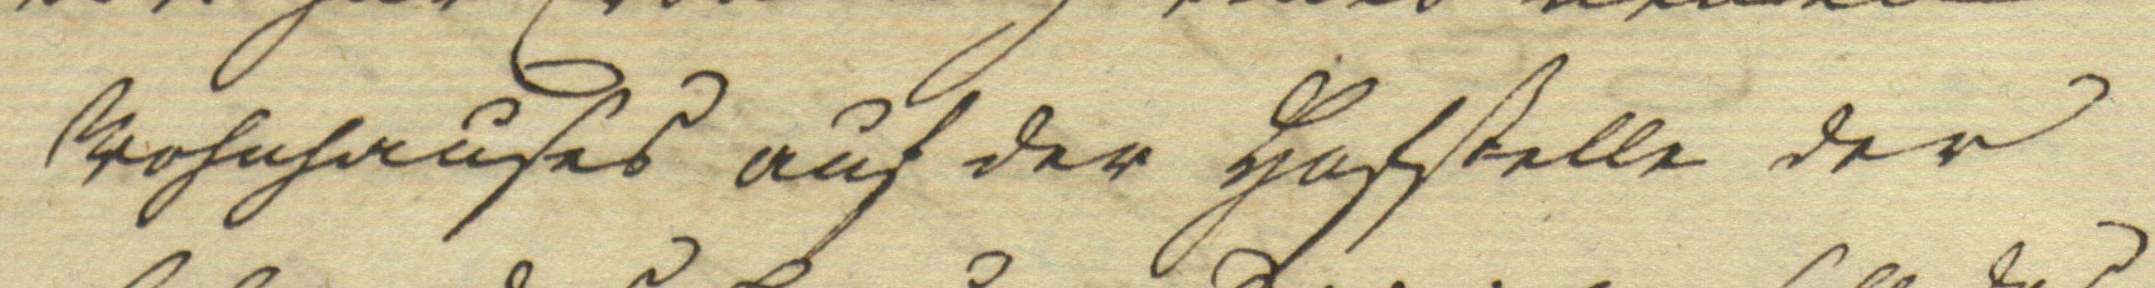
Wohnhauses auf der Hofstelle der
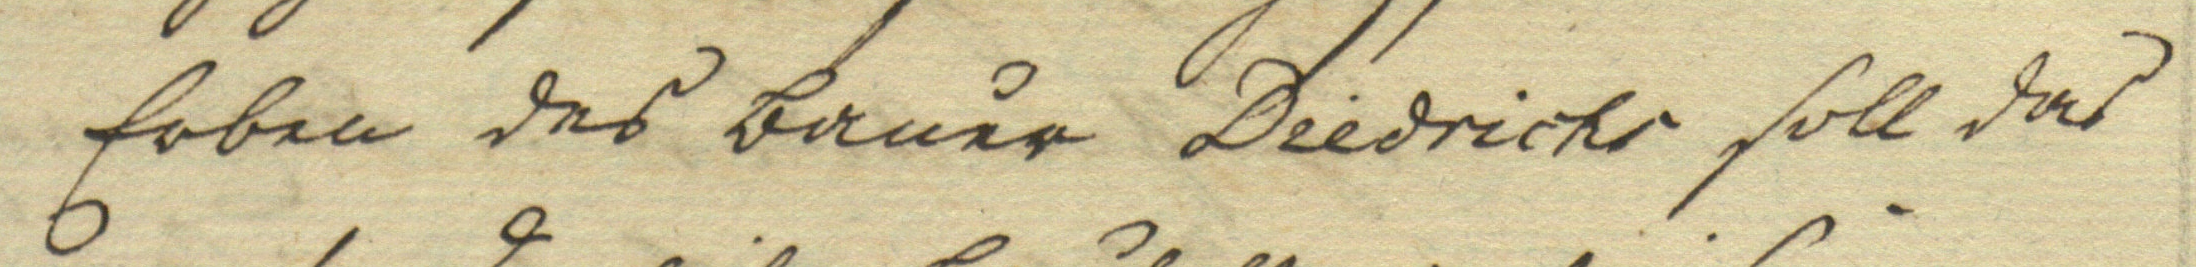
Erben des Bauer Diedrichs soll das
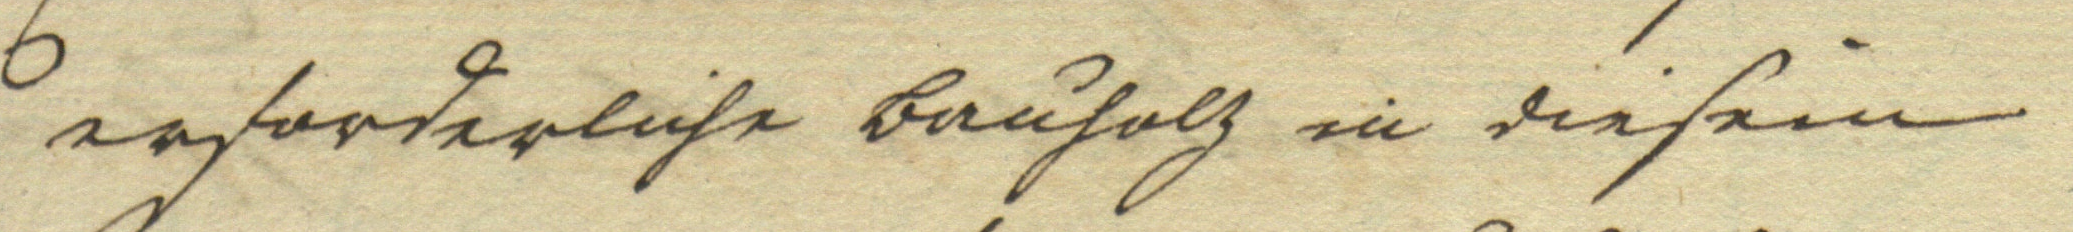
erforderliche Bauholz in diesem
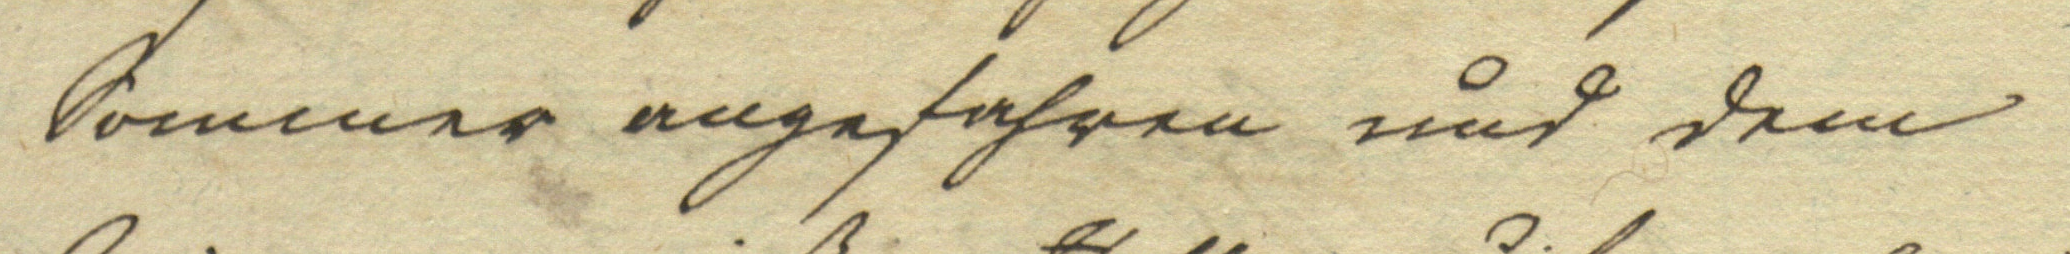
Sommer angefahren und dem
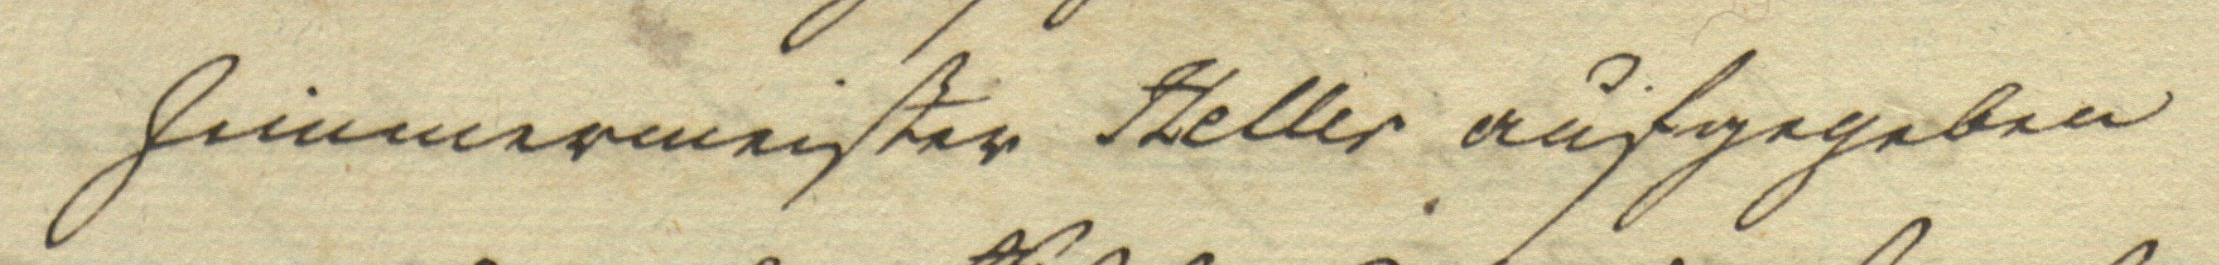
Zimmermeister Heller aufgegeben
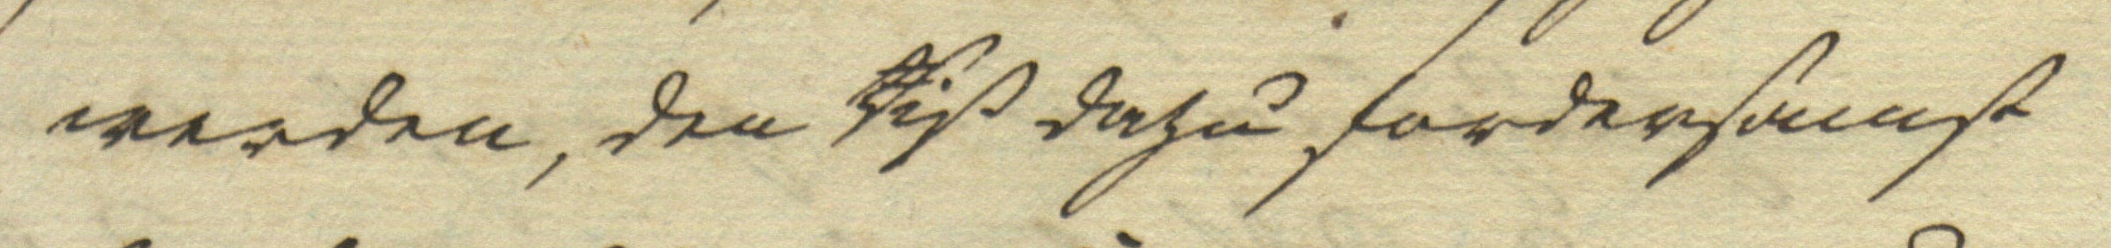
werden, den Riß dazu fordersamst
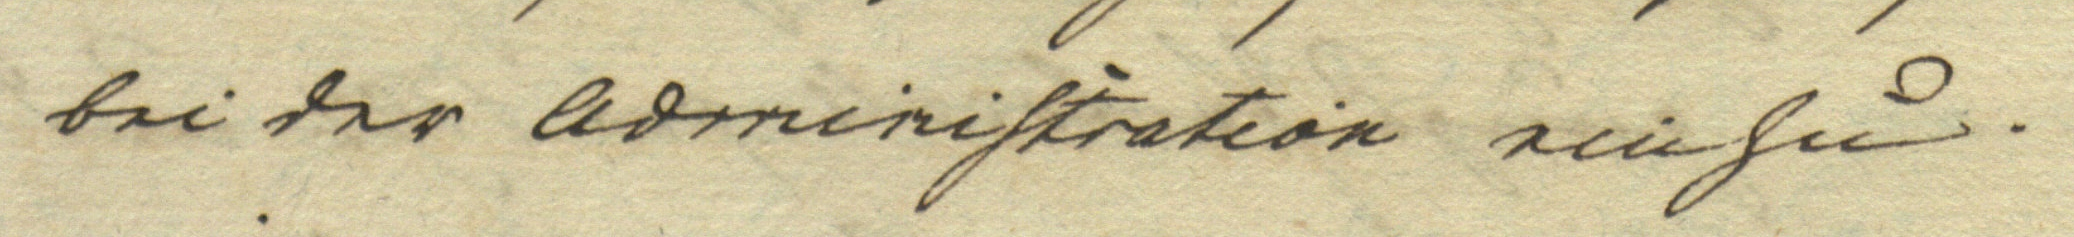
bei der Administration einzu¬
